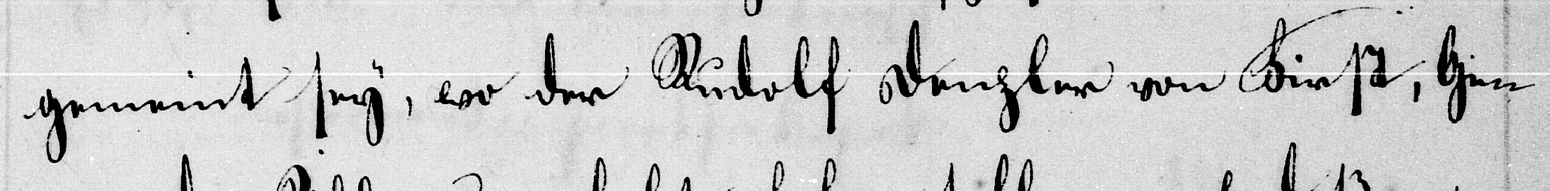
gemeint sey, wo der Rudolf Denzler von First, Ge¬
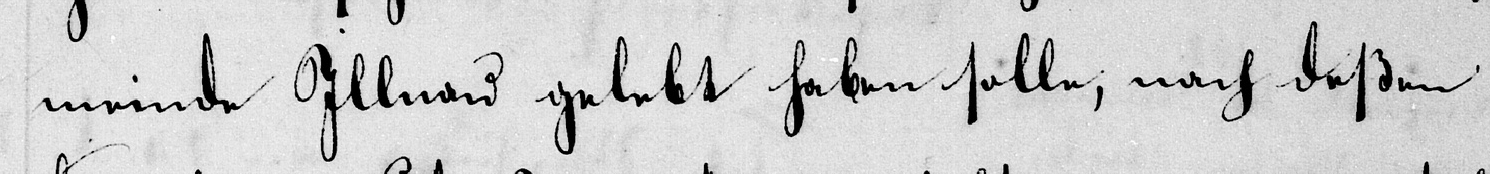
meinde Illnau gelebt haben solle, nach deßen
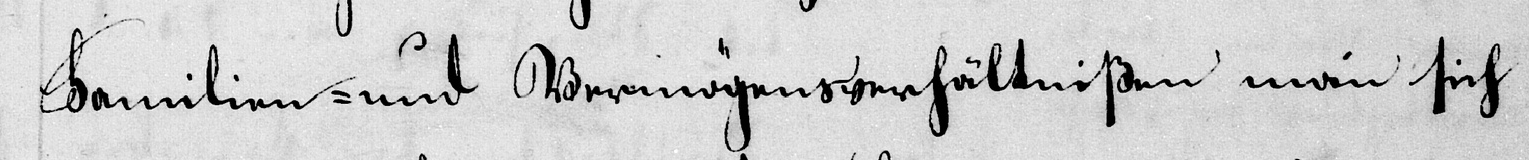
Familien- und Vermögensverhältnißen man sich
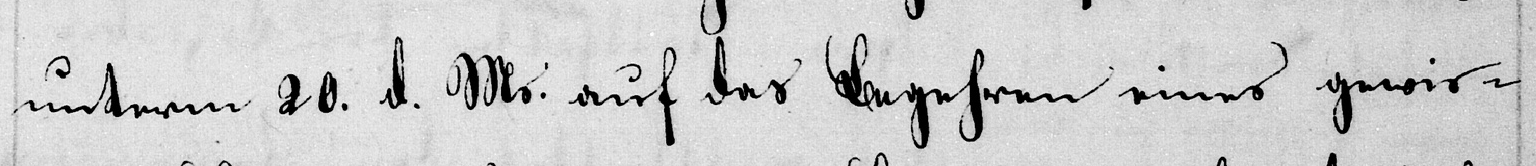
unterm 20. d. Ms. auf das Begehren eines gewiß¬
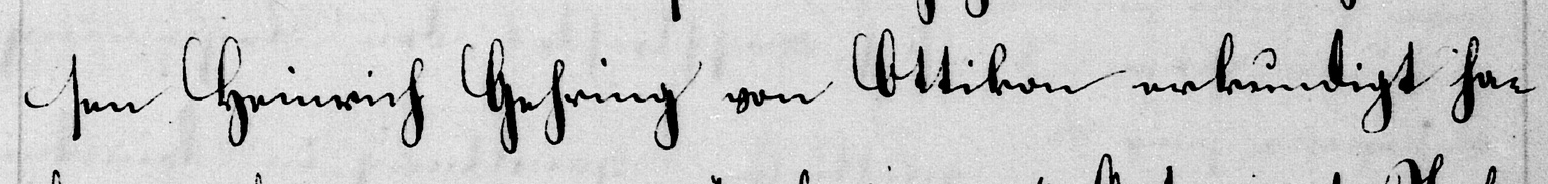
en Heinrich Gehring von Ottikon erkundigt ha¬
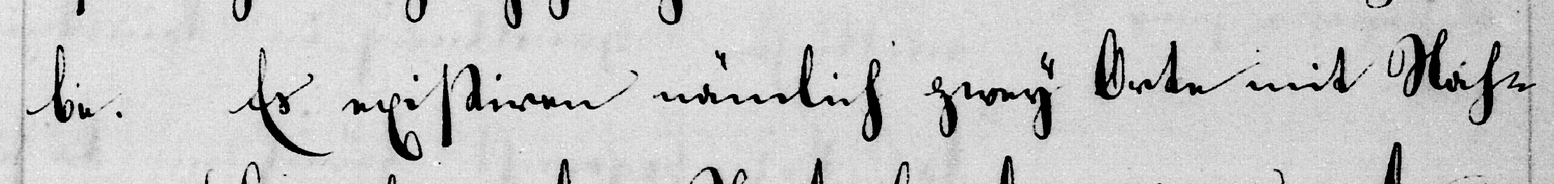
be. Es existiren nämlich zwey Orte mit Nah¬
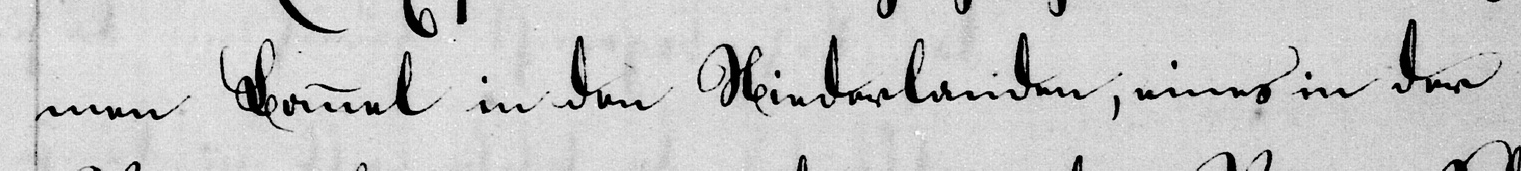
men Bommel in den Niederlanden, eines in der
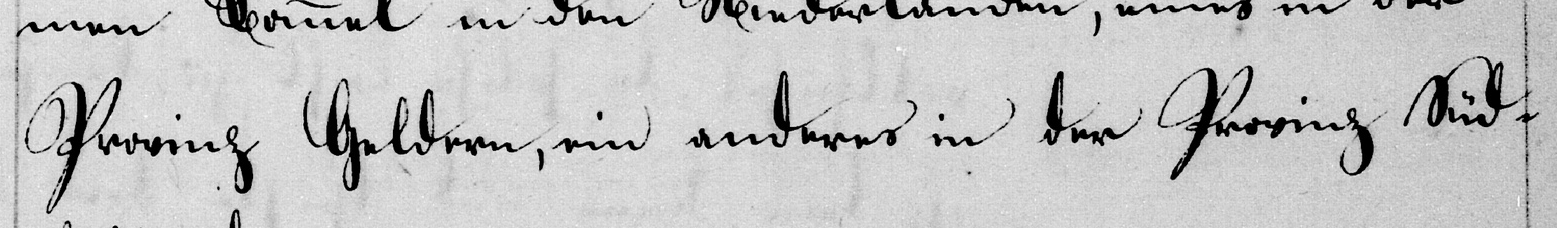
Provinz Geldern, ein anderes in der Provinz Süd¬
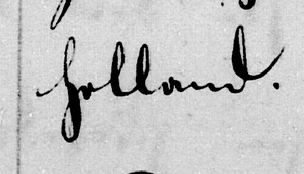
holland.
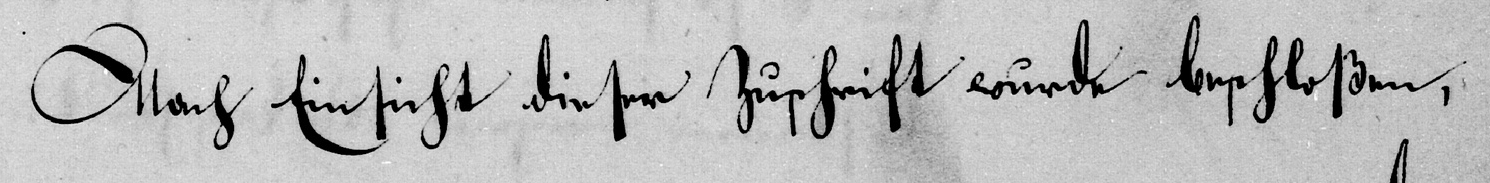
Nach Einsicht dieser Zuschrift wurde beschloßen,
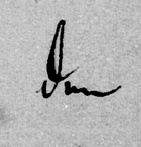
dem
